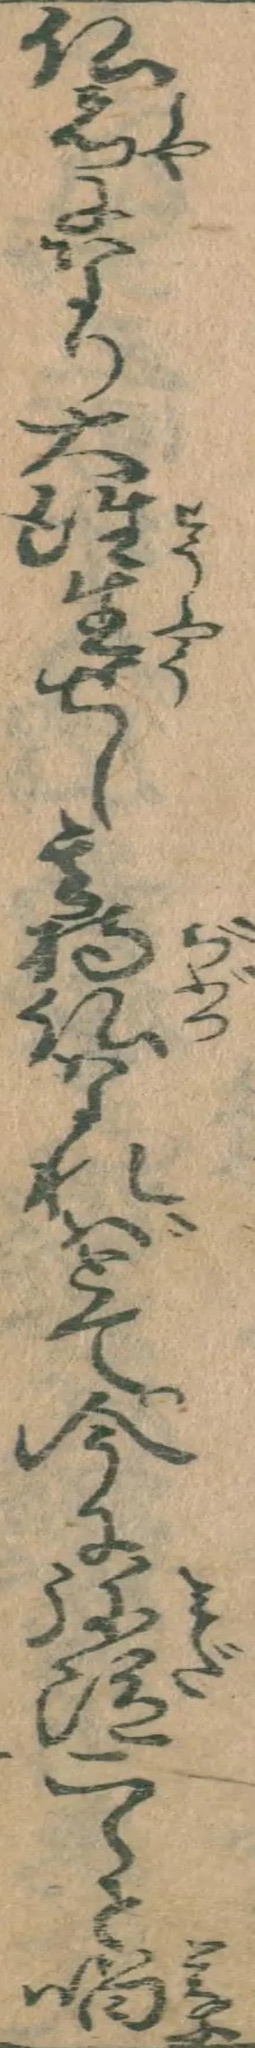仏者になり大往生せし其持仏なればとて。今に弥陀二郎と唱

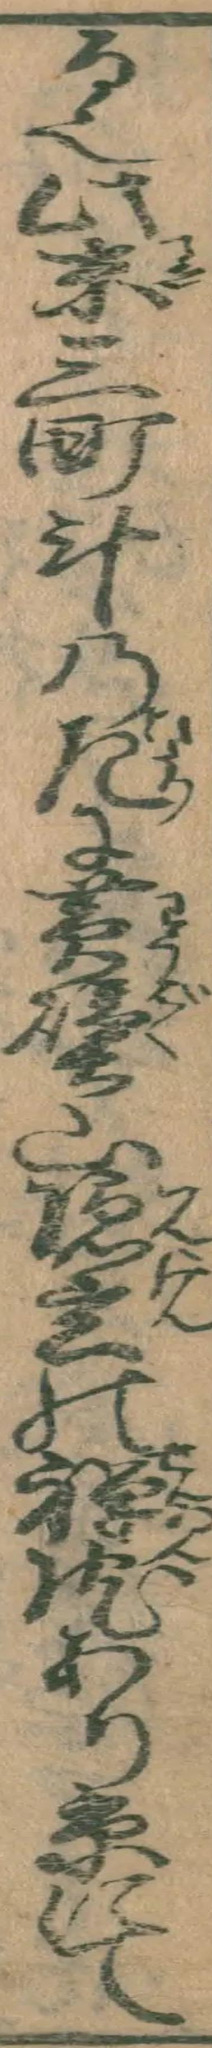る也此末三町計の左に黄檗山隠玄の禅院あり京にて
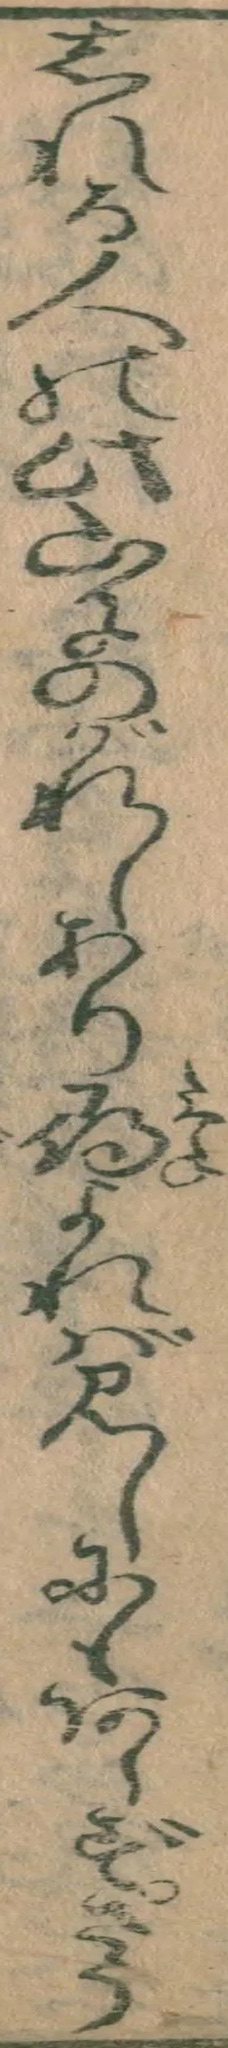しれる人の此山にのがれしあり尋よれば見しにもあらず。さう
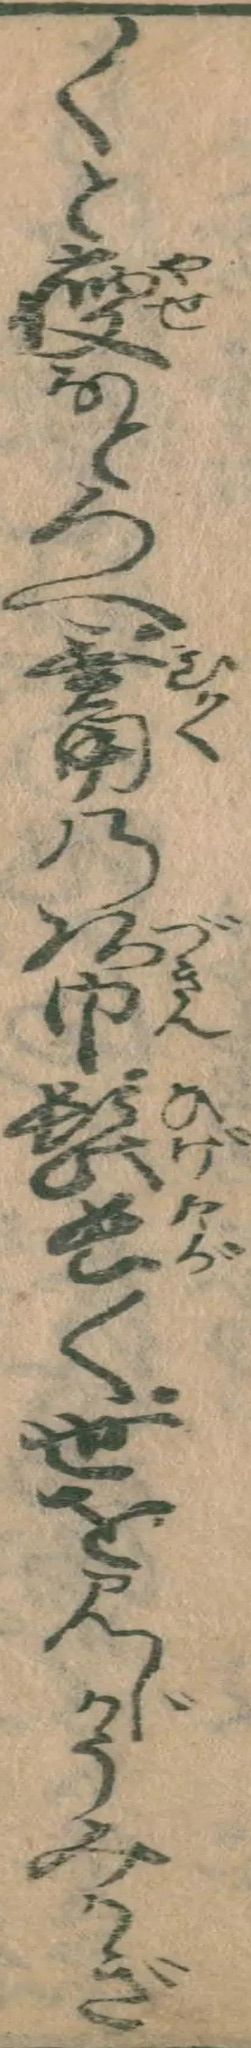〳〵と痩おとろへ。無角の頭巾髭長く。世を見じかうみかぎ
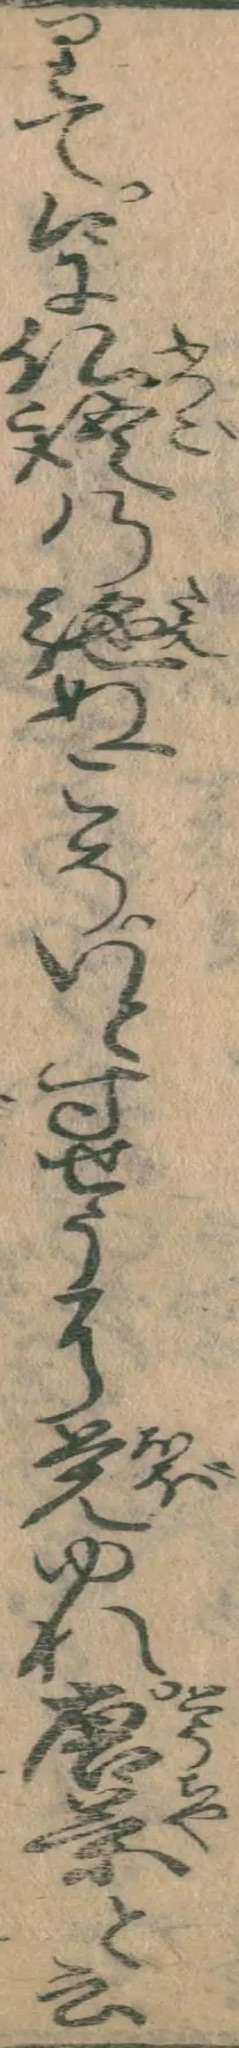りて。口に仏語の絶ぬこそ。いとすせうに覚ゆれ。唐茶と云
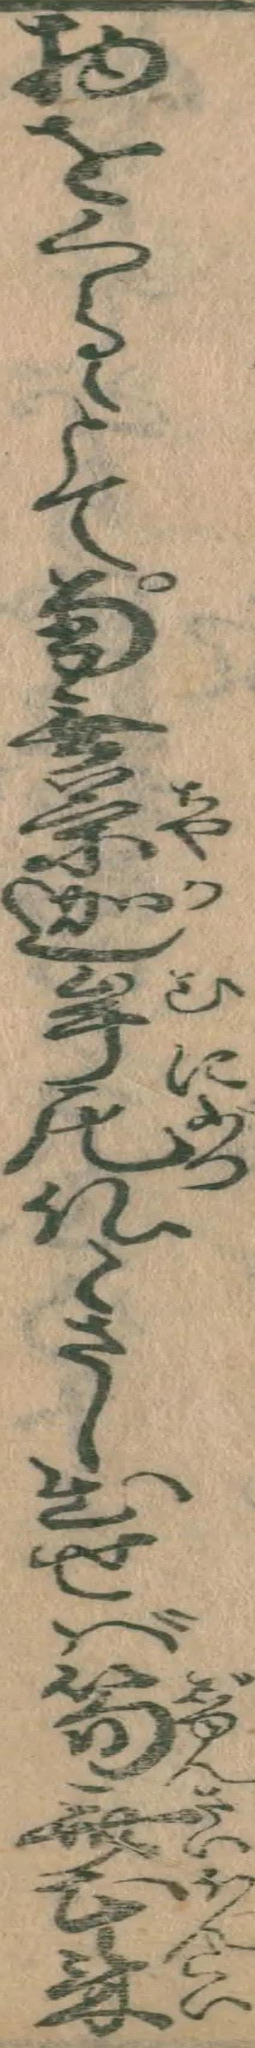物をくるゝとて。南無茶迦牟尼仏とさし出せば筍斎本来
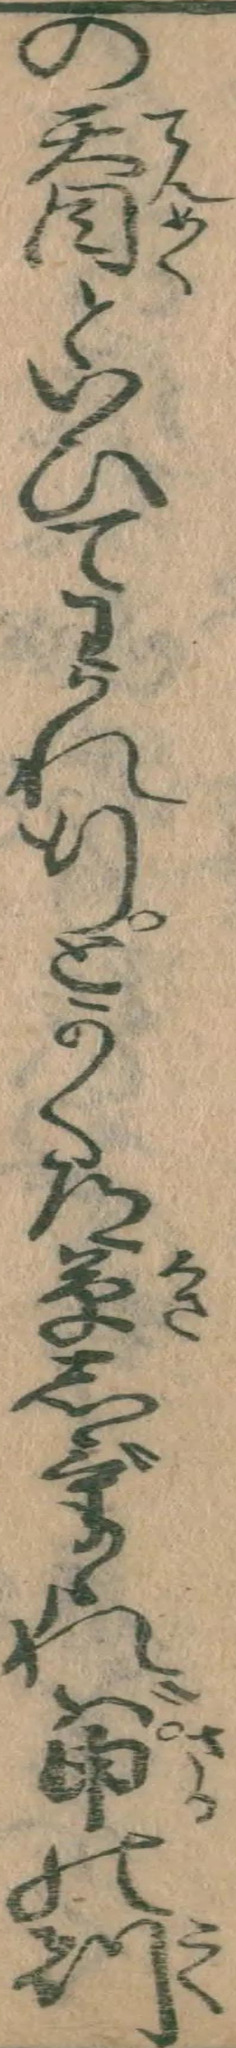の天目といひてわかれ行。とかく道草しげければ。申の刻
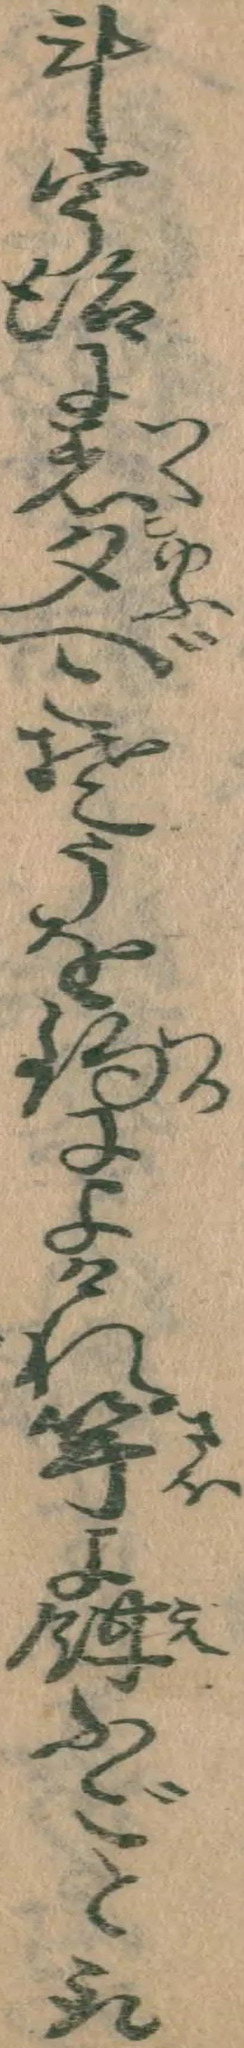計宇治に着。夕べこそうを釣によけれ竿に餌ふごと取
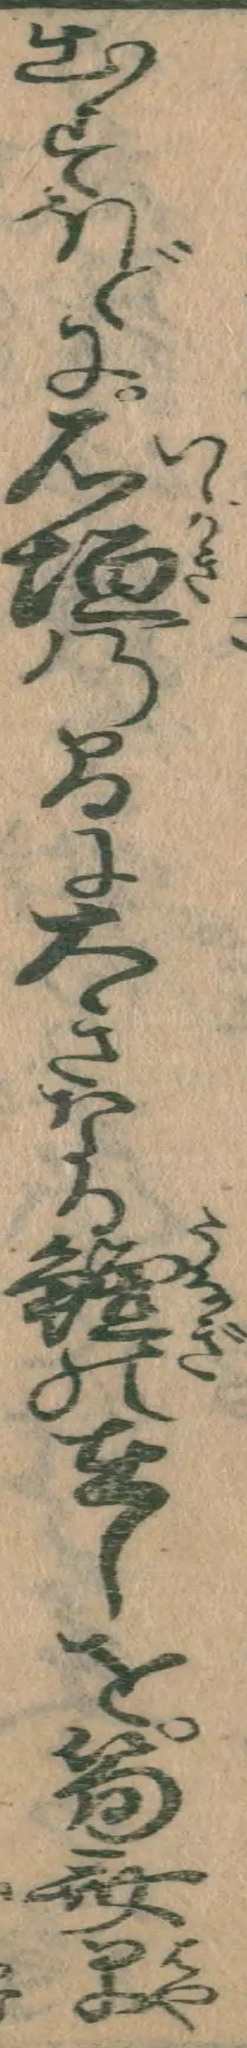出すほどに。石垣の間に大きなる鱣の在しを。筍斎早
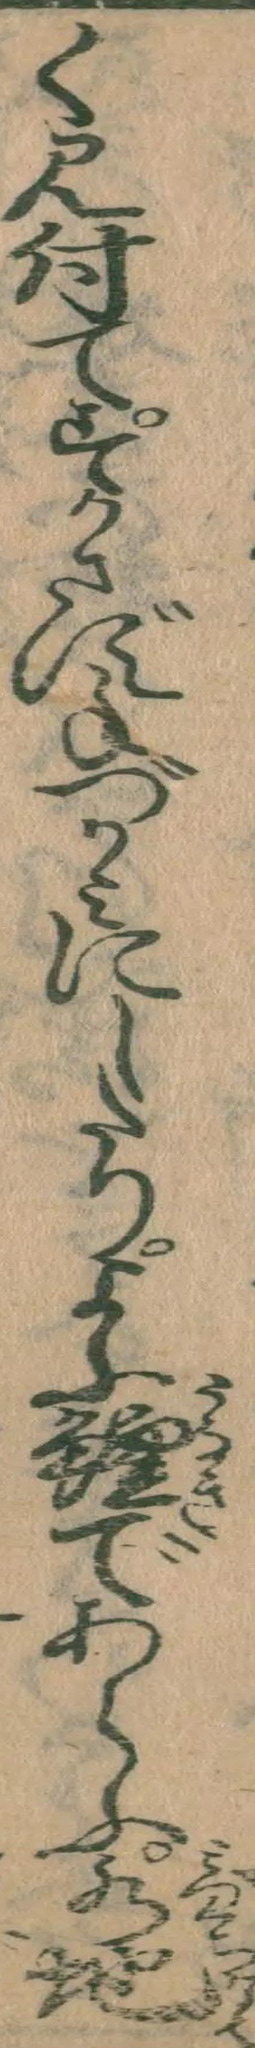く見付て。すかさず手づかみにしたり。よふ鱣であらふ。水蛇
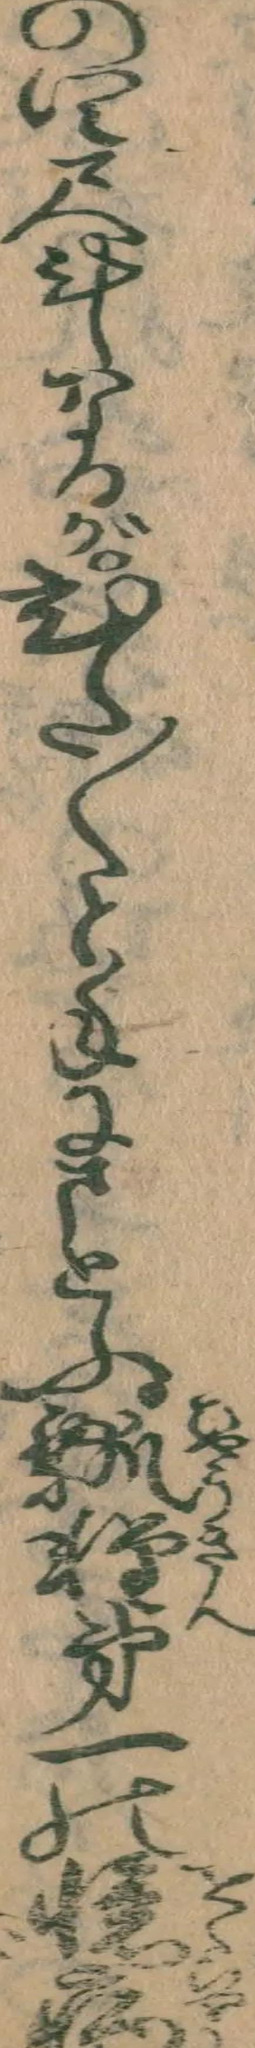の四尺計なるが。ひた〳〵と手にまとふ。瓢軽第一の憶病
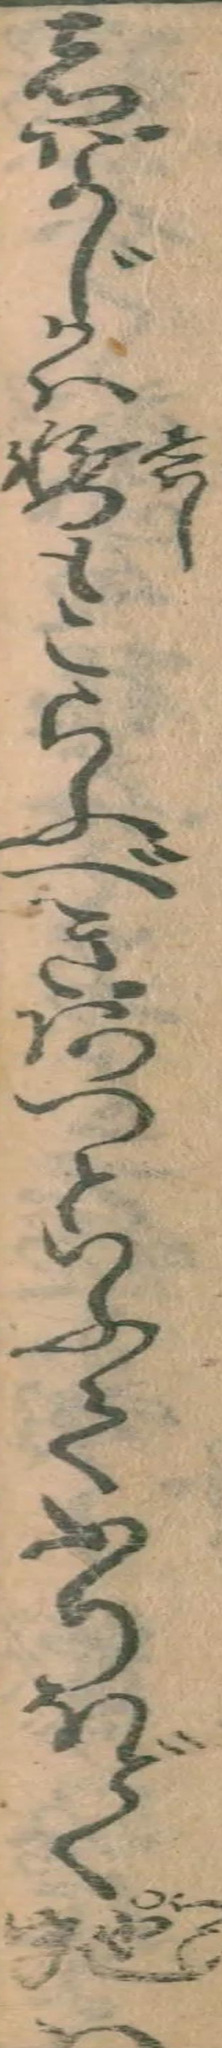者。なじかは暫もこらふべき。あつといふてふりほどく。蛇は
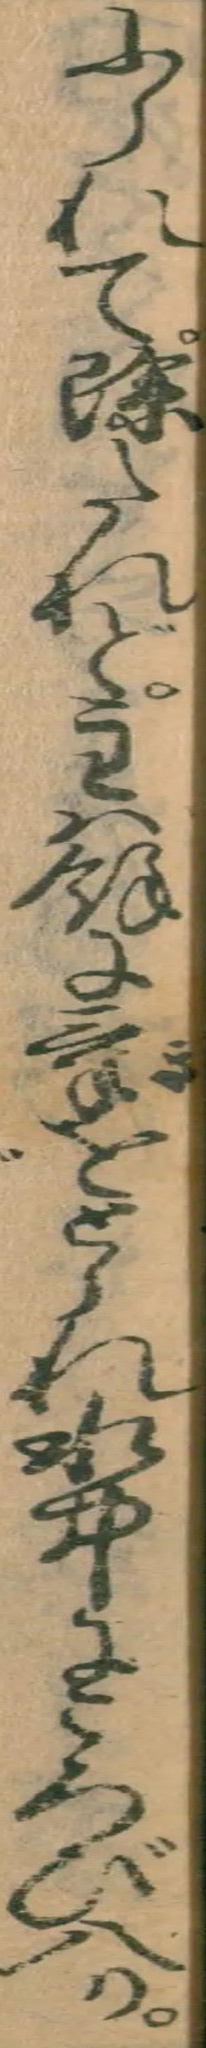ふられて。除たれど。主は余に気をとられ水中にころび入り。
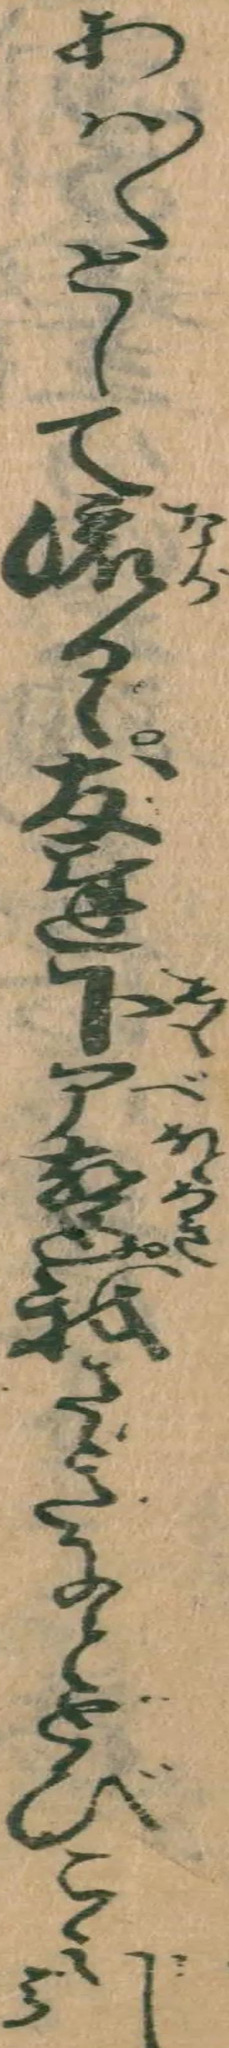あは〳〵として流るゝ。友達下部驚。我さきにとどびこみ引
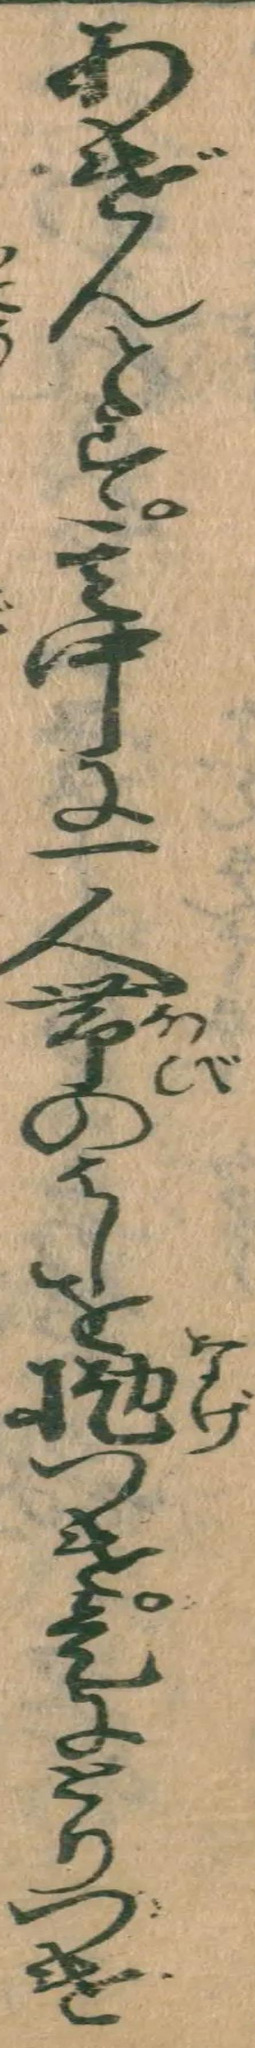あげんとす。其中に一人帯のはしを抛つけ。是にとりつけ
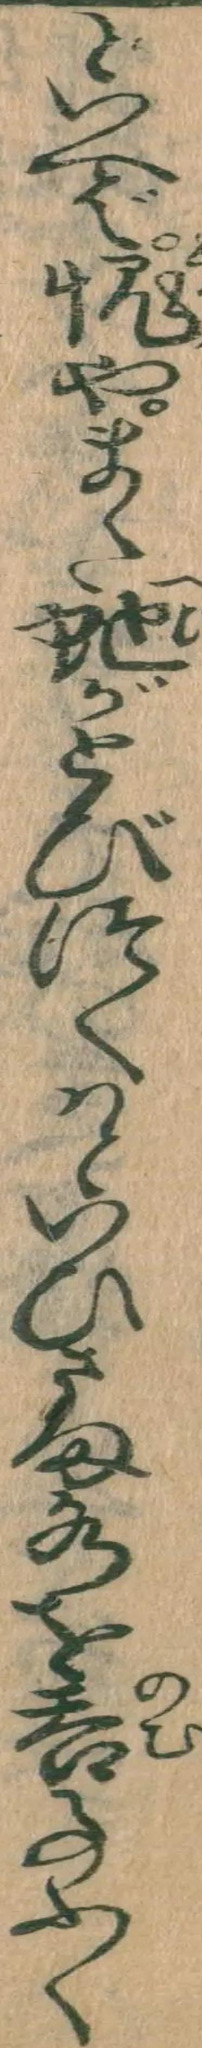といへば。恐や。また蛇がとびつくかといひさま水を呑事ふく
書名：新竹斎 5巻
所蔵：国立国会図書館 National Diet Library, JAPAN
